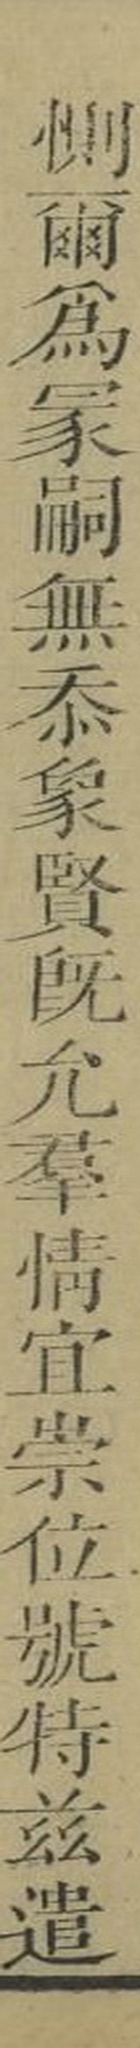惻爾為冡嗣無忝象賢既允群情宜崇位号特茲遣
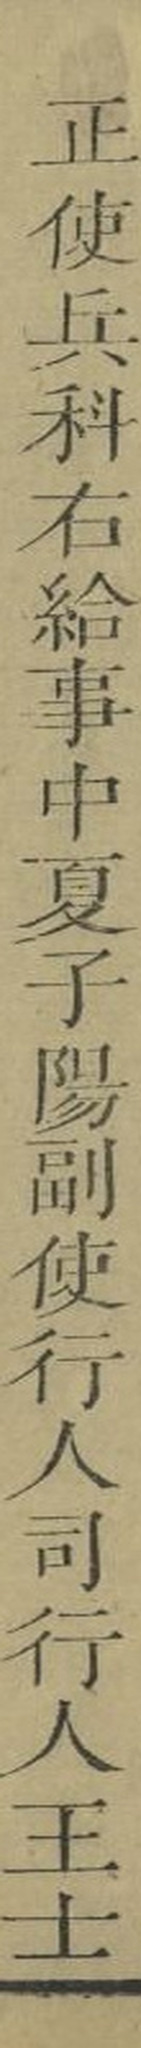正使兵科右給事中夏子陽副使行人司行人王士
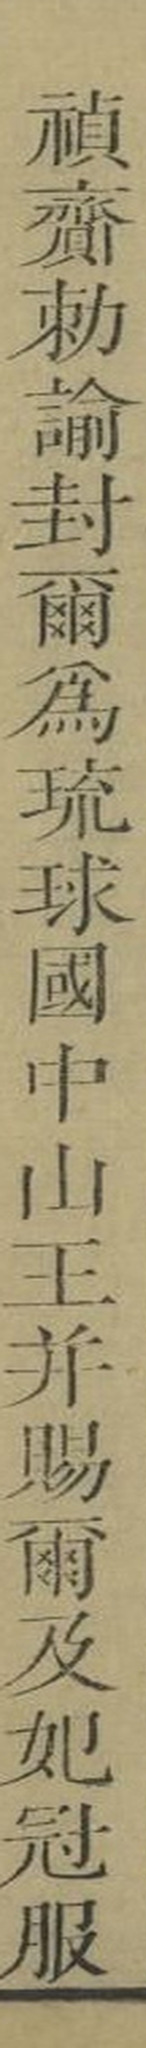禎齎勅諭封爾為琉球国中山王并賜爾及妃冠服
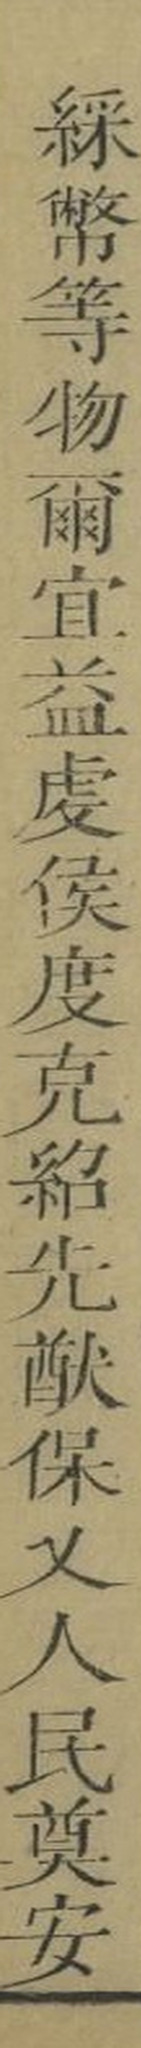綵幣等物爾宜益虔侯度克紹先猷保乂人民奠安

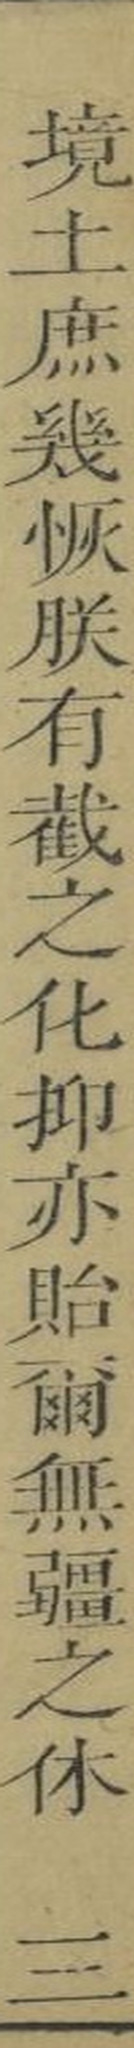境土庶幾恢朕有截之化抑亦貽爾無疆之休三
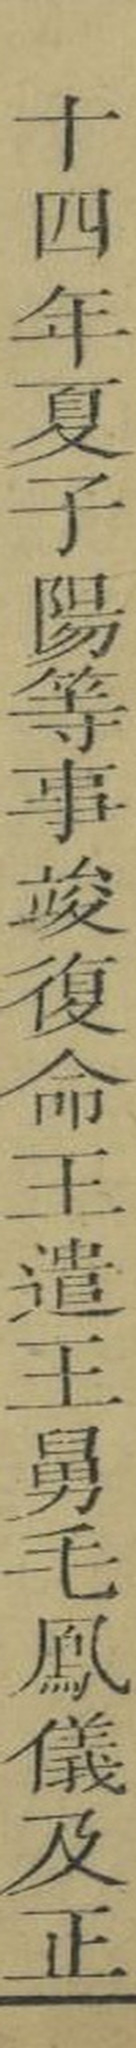十四年夏子陽等事竣復命王遣王舅毛鳳儀及正
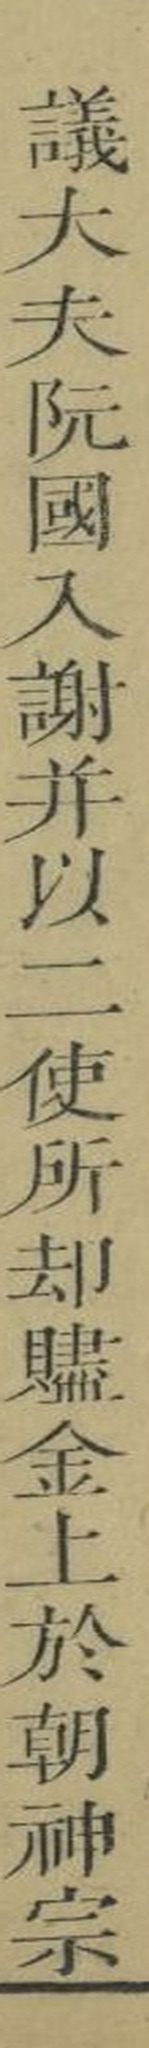議大夫阮国入謝并以二使所却贐金上於朝神宗
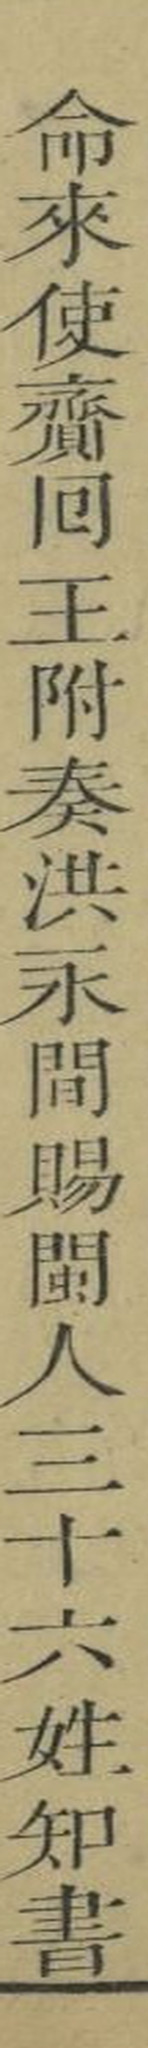命来使齎回王附奏洪永間賜閩人三十六姓知書
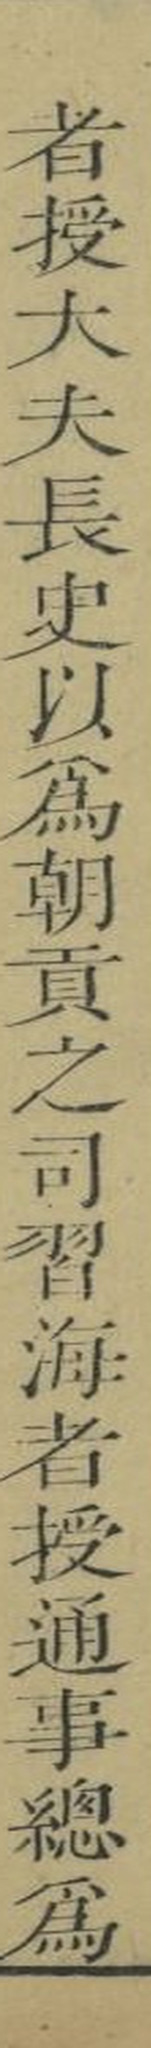者授大夫長史以為朝貢之司習海者授通事総為
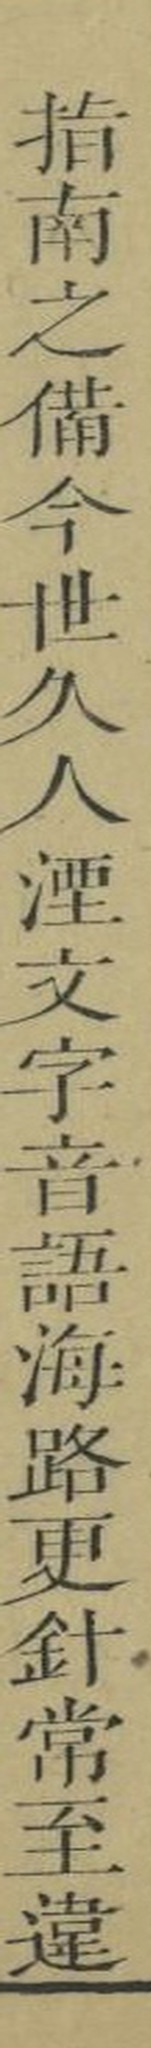指南之備今世久人湮文字音語海路更針常至違
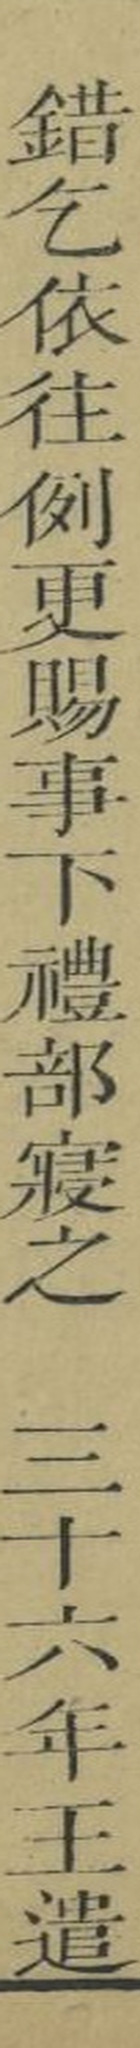錯乞依往例更賜事下礼部寝之三十六年王遣
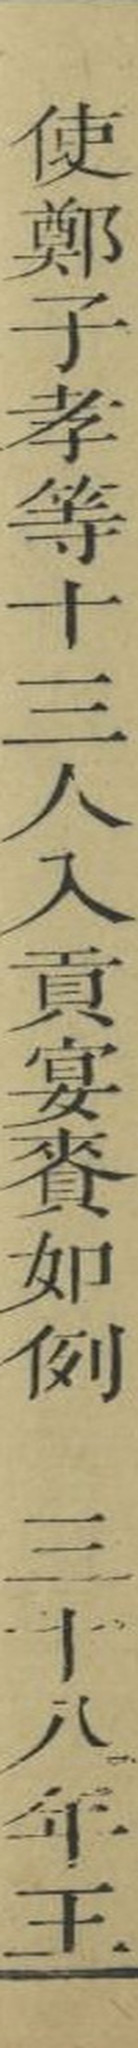使鄭子孝等十三人入貢宴賚如例三十八年王
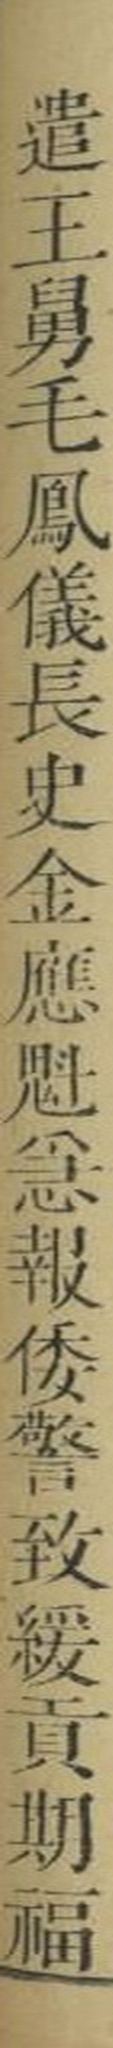遣王舅毛鳳儀長史金応魁急報倭警致緩貢期福
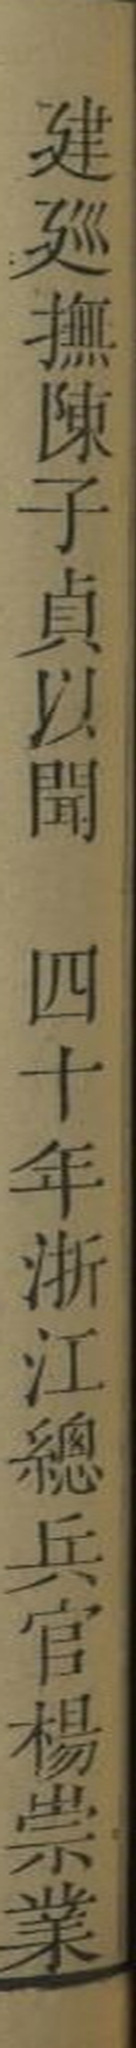建巡撫陳子貞以聞四十年浙江総兵官楊崇業
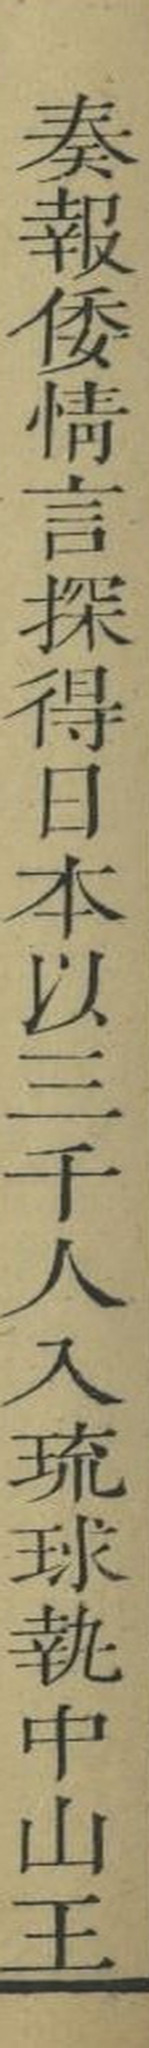奏報倭情言探得日本以三千人入琉球執中山王
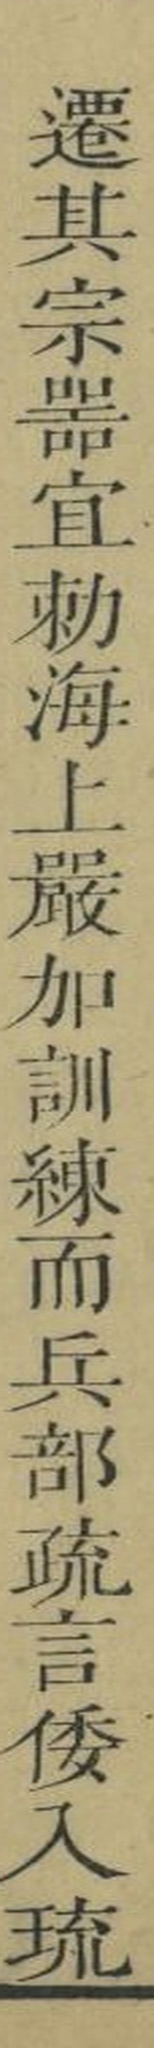遷其宗器宜勅海上厳加訓練而兵部疏言倭入琉
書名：中山伝信録 巻三
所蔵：University of the Ryukyus Library
